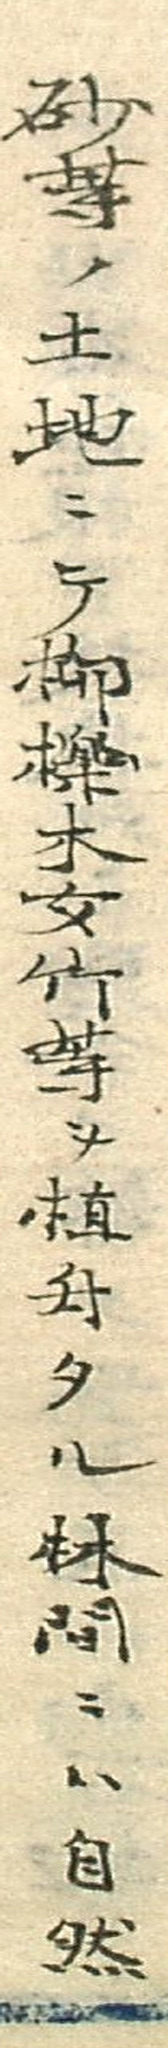砂等ノ土地ニテ柳櫟木女竹等ヲ植付タル林間ニハ自然
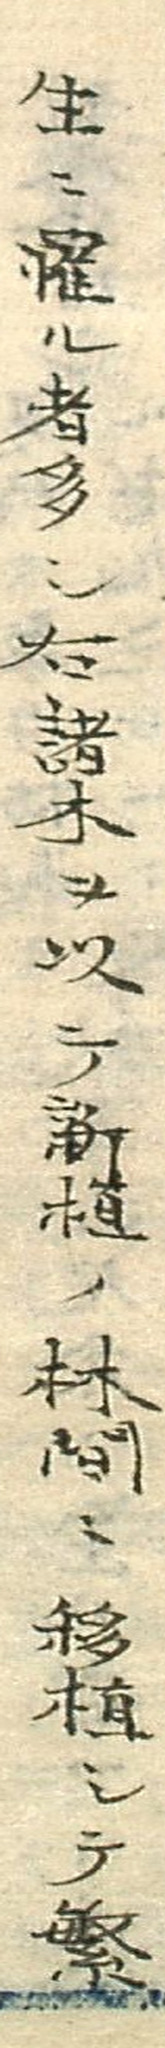生ニ罹ル者多シ右諸木ヲ以テ新植ノ林間ニ移植シテ繁
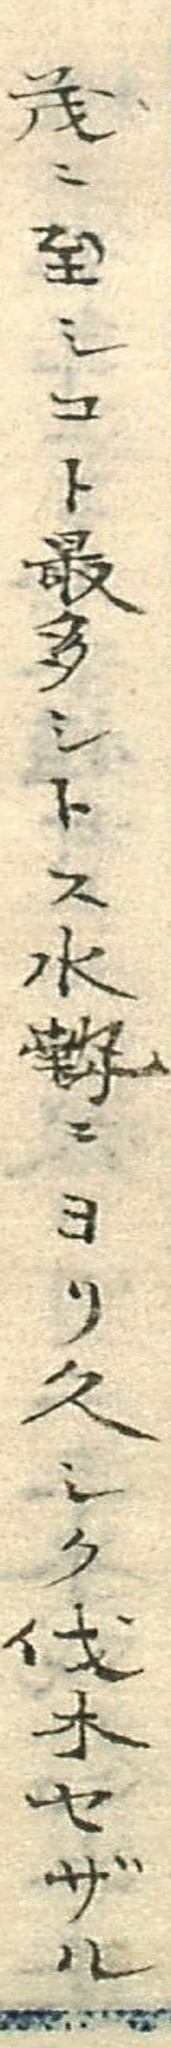茂ニ至シコト最多シトス水勢ニヨリ久シク伐木セザル
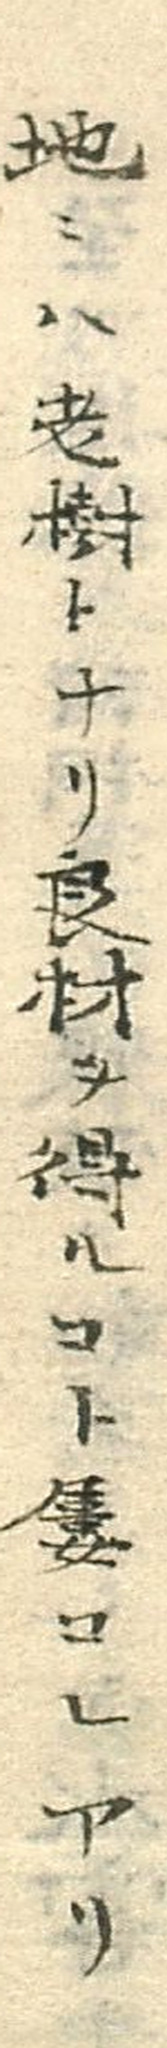地ニハ老樹トナリ良材ヲ得ルコト屡コレアリ
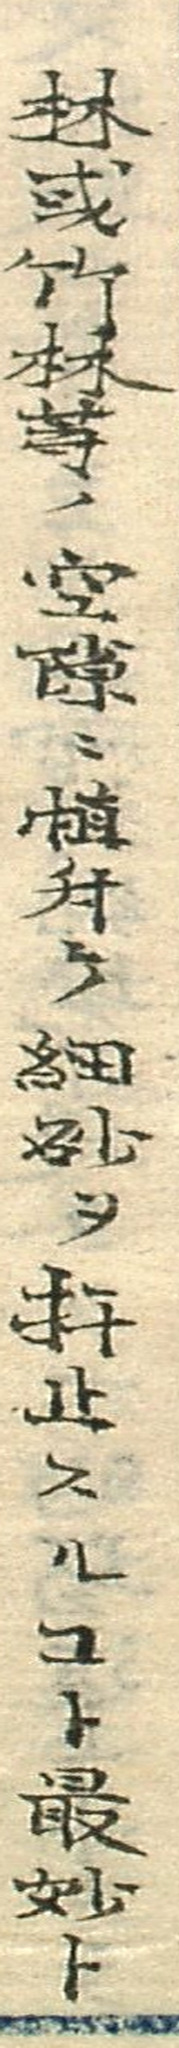林或竹林等ノ空隙ニ植付ケ細砂ヲ扞止スルコト最妙ト
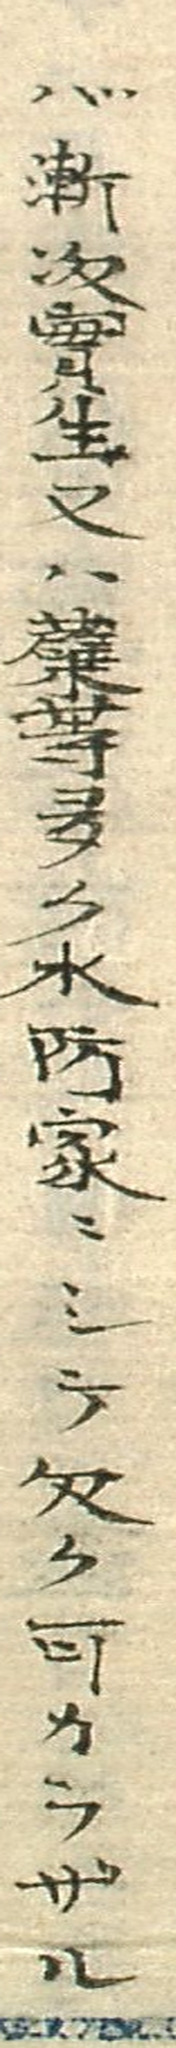バ漸次実生又ハ蘗等多ク水防家ニシテ欠ク可カラザル
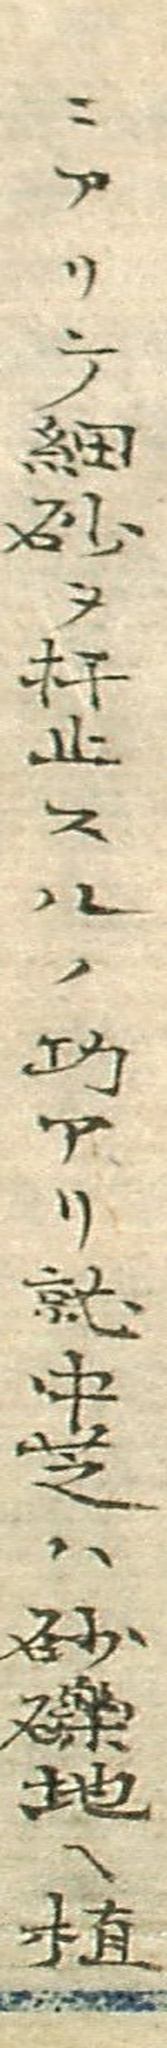ニアリテ細砂ヲ扞止スルノ功アリ就中芝ハ砂礫地ヘ植
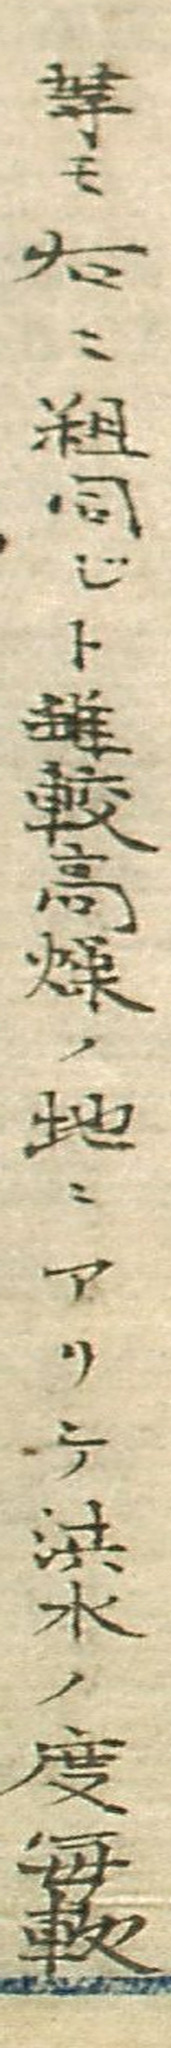等モ右ニ粗同ジト雖較高燥ノ地ニアリテ洪水ノ度毎軟
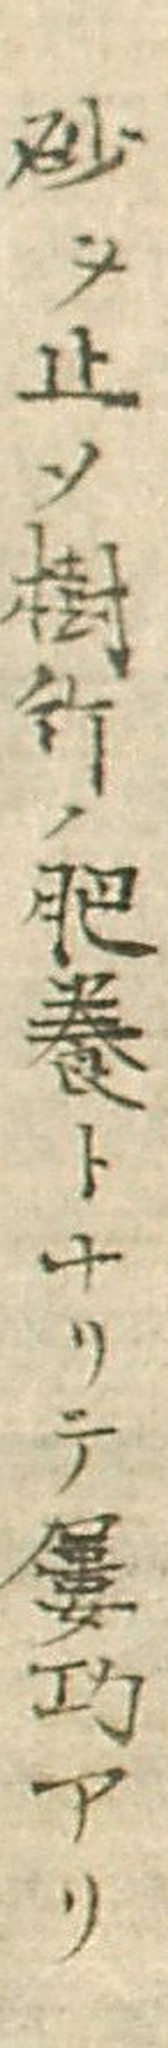砂ヲ止メ樹竹ノ肥養トナリテ屡功アリ

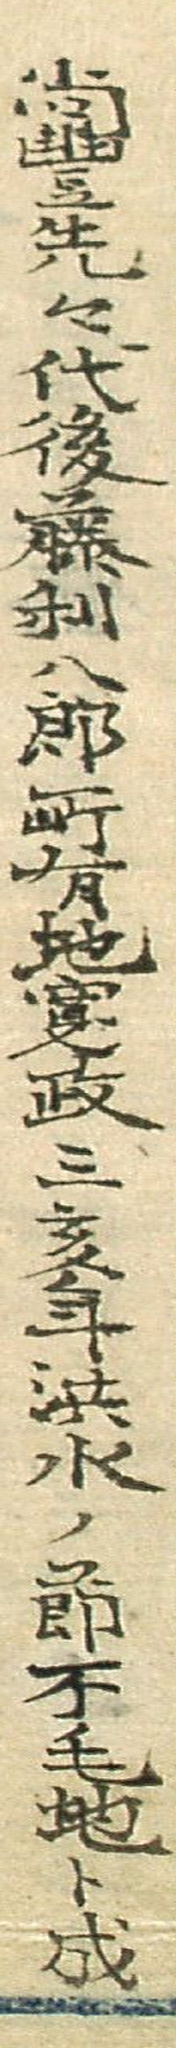尚豊先々代後藤利八郎所有地寛政三亥年洪水ノ節不毛地ト成
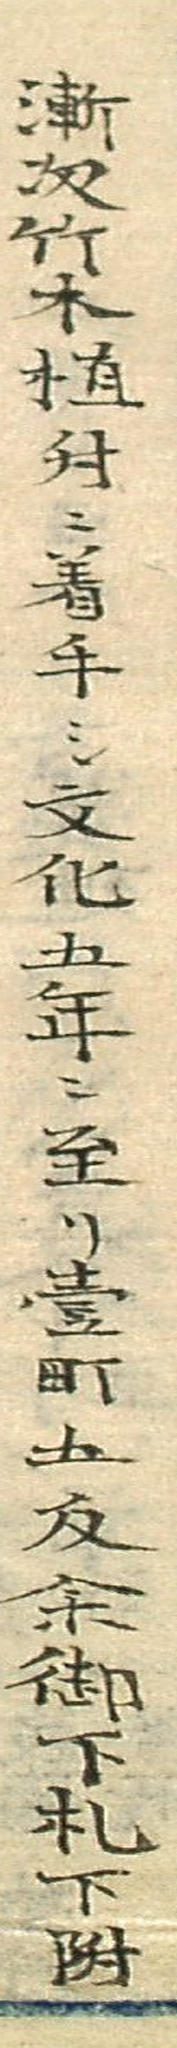漸次竹木植付ニ着手シ文化五年ニ至リ壱町五反余御下札下附
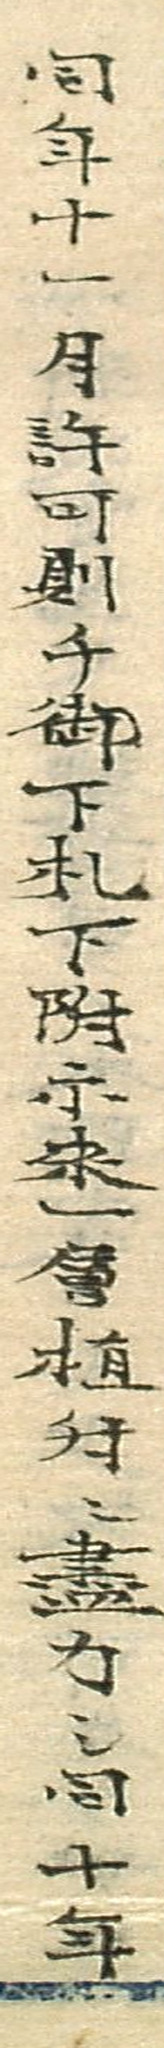同年十一月許可則チ御下札下附示来一層植付ニ尽力シ同十年
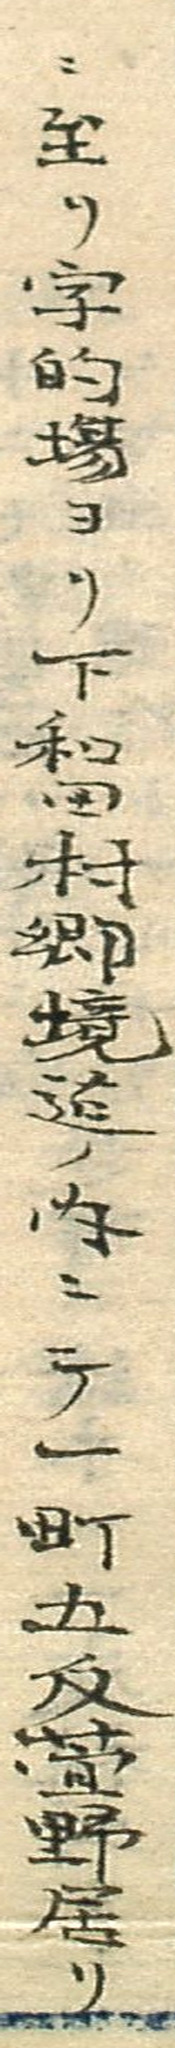ニ至リ字的場ヨリ下和田村郷境迄ノ内ニテ一町五反萱野居リ
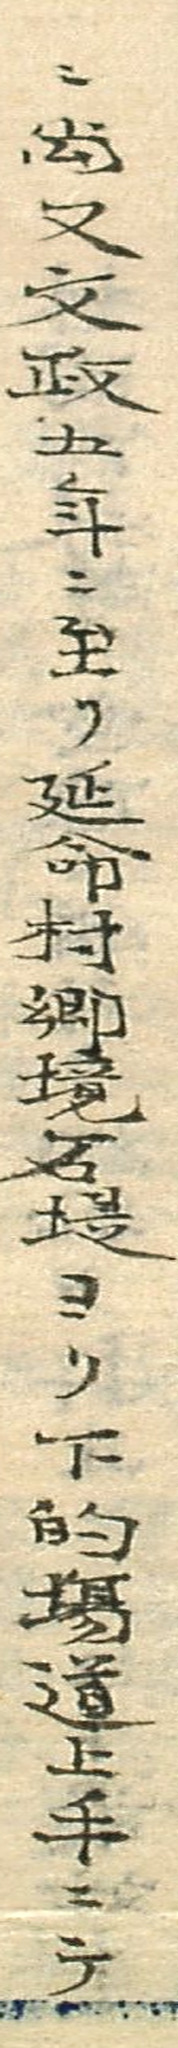ニ尚又文政五年ニ至リ延命村郷境石堤ヨリ下的場道上手ニテ
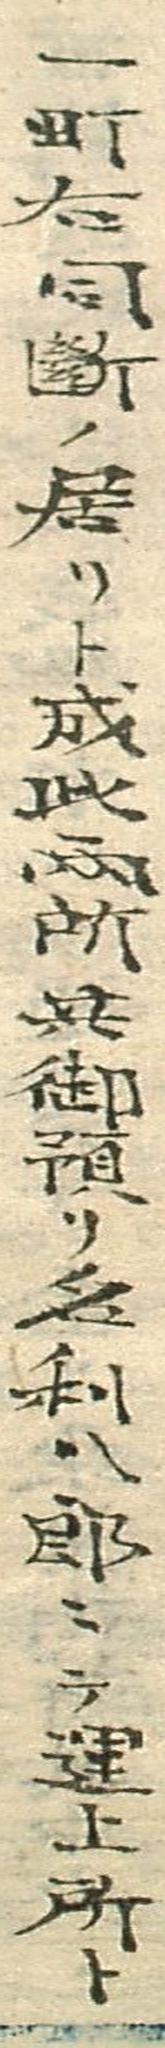一町右同断ノ居リト成此両所共御預リ名利八郎ニテ運上所ト
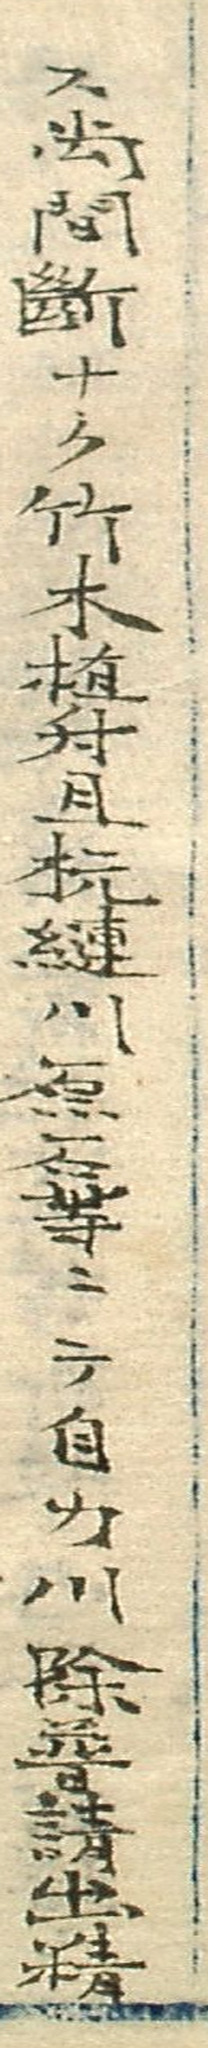ス尚間断ナク竹木植付且杬縺川原石等ニテ自力川除普請出精
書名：山林共進会取調書
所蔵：鳴門教育大学 Naruto University of Education
